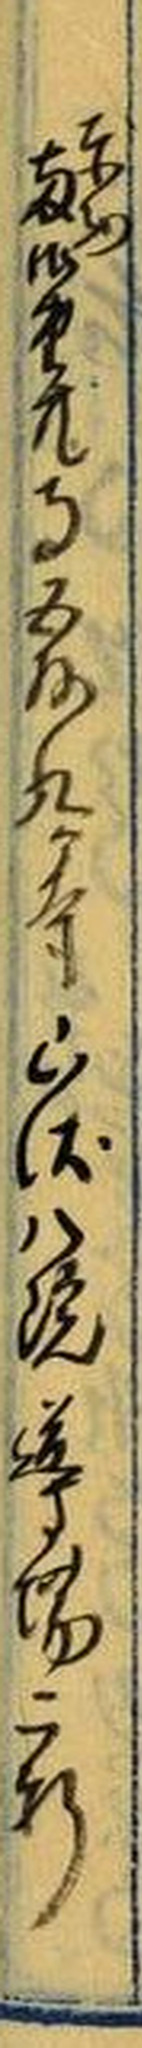東西両御堂共寺五拾九ヶ寺山伏八院導場二軒
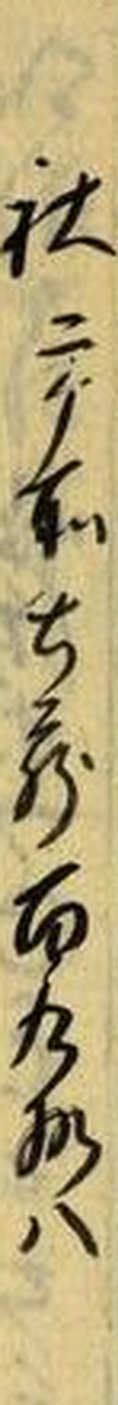社二ヶ所土蔵百九拾八
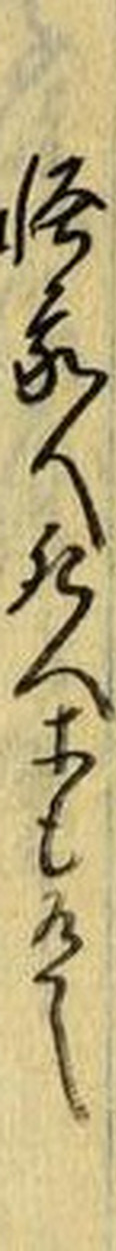怪我人死人等も有之
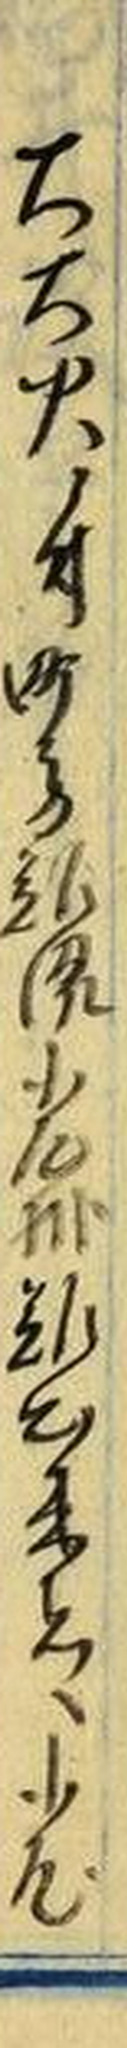大大火に付町方難渋小屋掛難出来者へ小屋
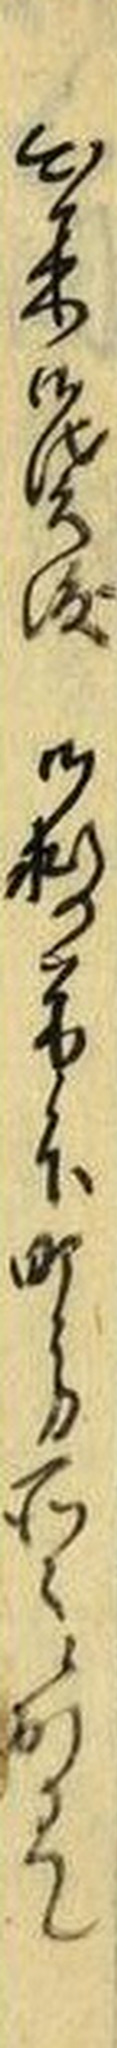出来御貸渡御救米被下町方所々におゐて
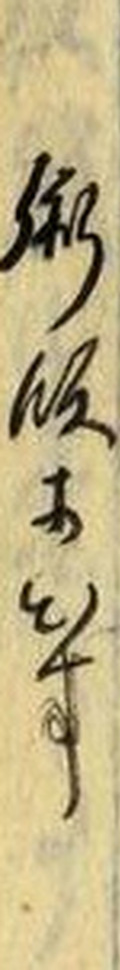粥飯等出す
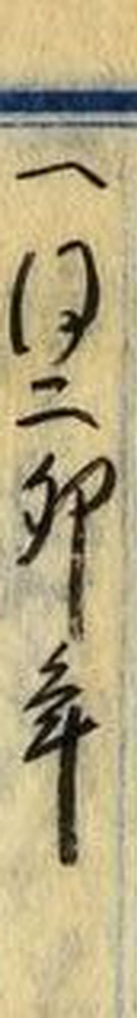一同二卯年
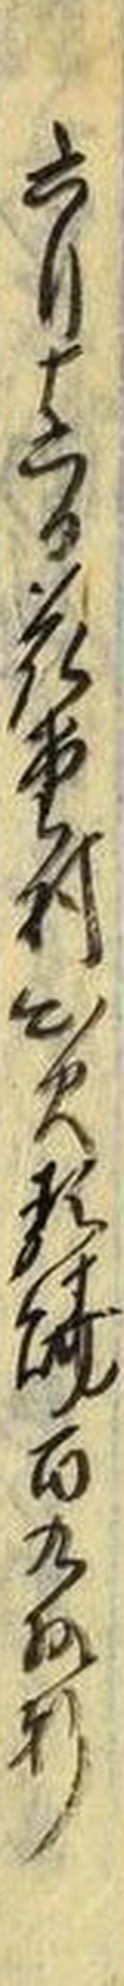六月十二日花堂村出火類焼百九拾軒
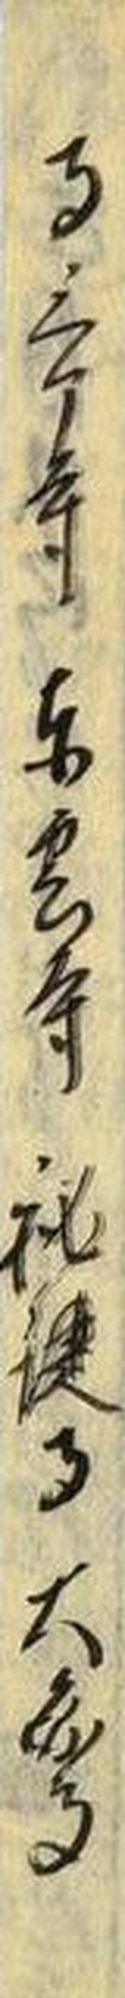寺三ヶ寺東雲寺秘鍵寺大円寺
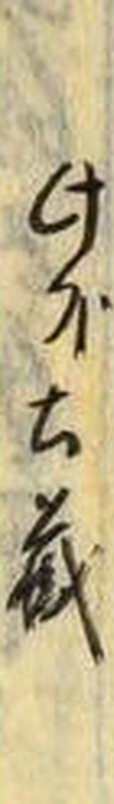此外土蔵

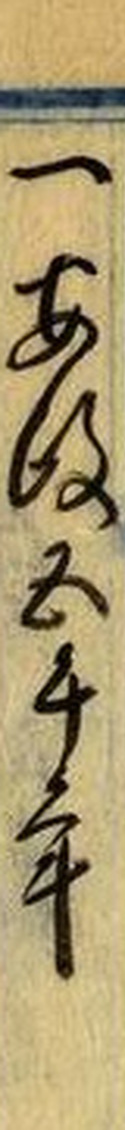一安政五午年
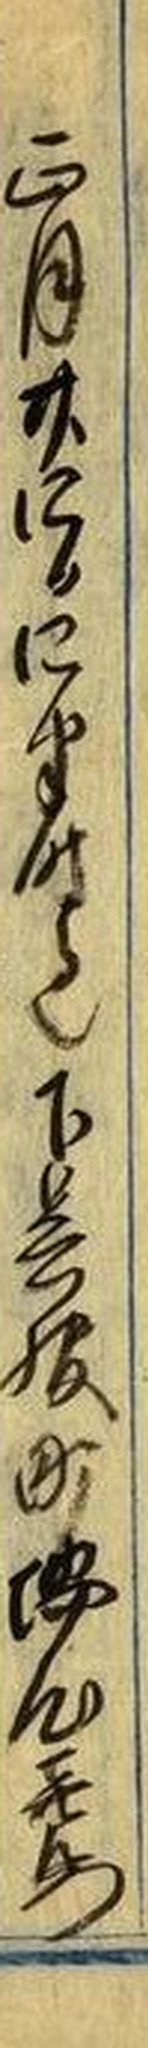正月廿四日四半時迄下呉服町堺屋喜左衛門
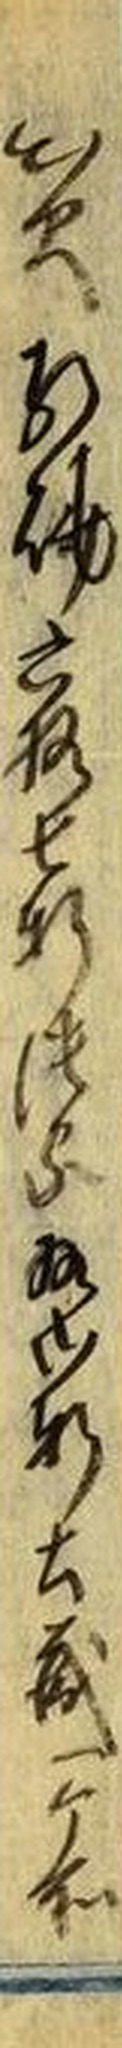出火類焼六拾七軒潰家拾弐軒土蔵一ヶ所
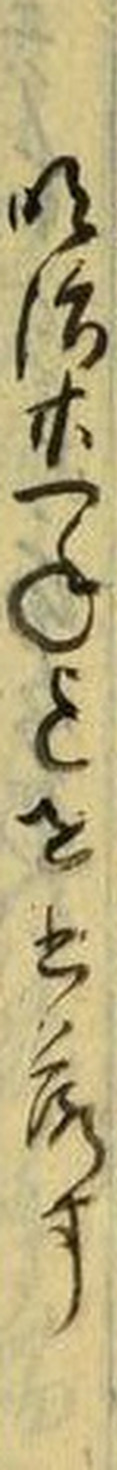明治廿一年迄を書落す
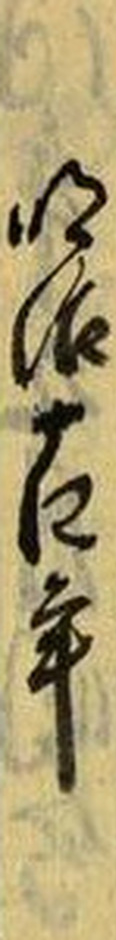明治十四年
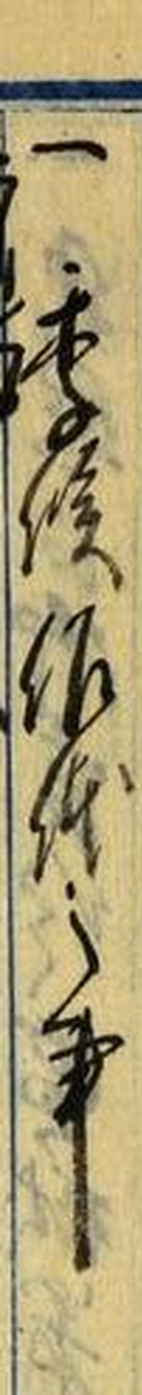一季候作体之事
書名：温古集 五巻
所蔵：福井県文書館 Fukui Prefectural Archives
